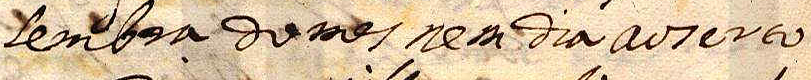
lembra do mes nem dia ao serto
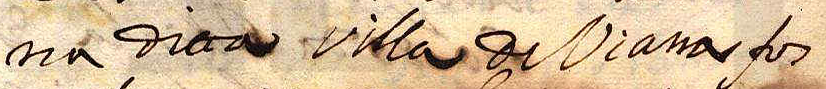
na ditta villa de Viana fos
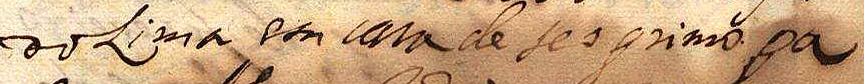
do Lima em caza de seo primo pa
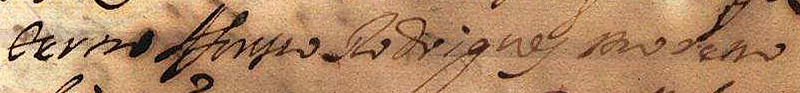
terno Afonsso Rodrigues moreno
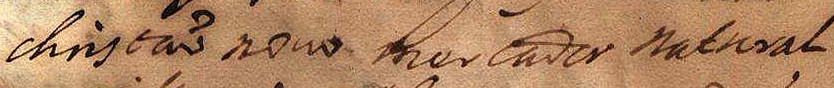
christaõ nouo mercador natural
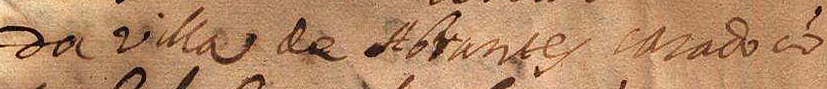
da villa de Abrantes cazado cō
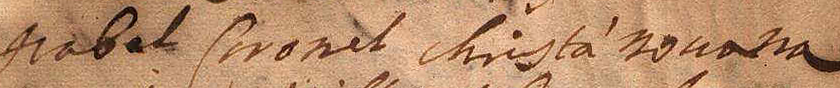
Jzabel Coronel christā noua na
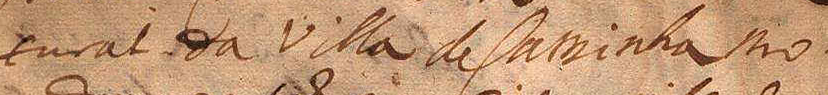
tural da Villa de Caminha mo
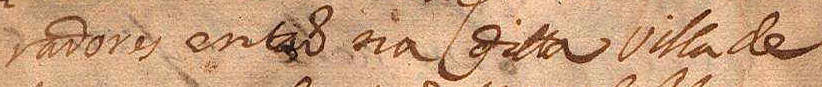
radores entaõ na ditta Villa de
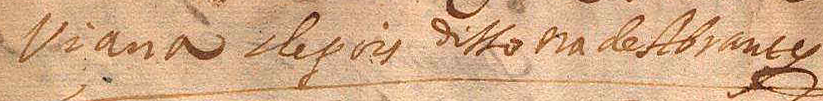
Viana depois disso na de Abrantes
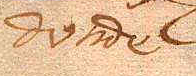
donde
